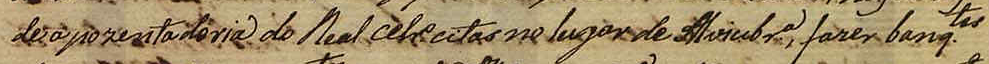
de apozentadoria do Real celr.o citas no lugar de Alviubr.a, fazer banq.tas
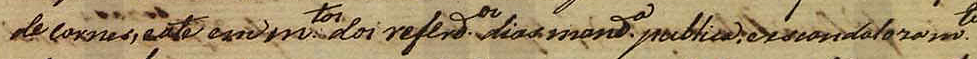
de carnes, e ate em m.tos dos referd.os dias mand.a publica; e escandalozam.te
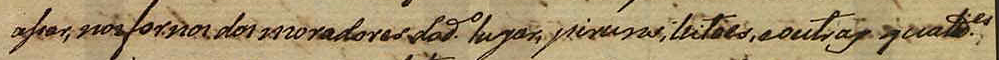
assar, nos fornos dos moradores do d.o lugar, piruns, leitoes, e outras qualid.es
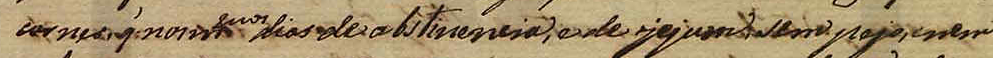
carnes, q̄ nos mmos dias de abstinencia, e de jejum sem pejo, e nem
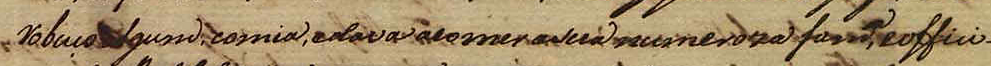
robuço _lgum, comia, e dava a comer a sua numeroza fama, e offici
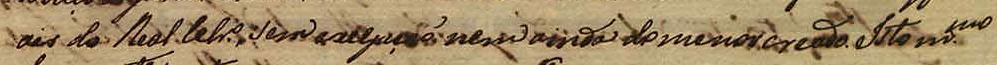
aes do Real Celr.o, sem excepçaõ nem ainda do menor creado. Isto m.mo
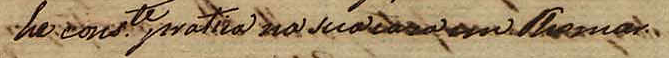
he cons.te pratica na sua caza em Thomar.
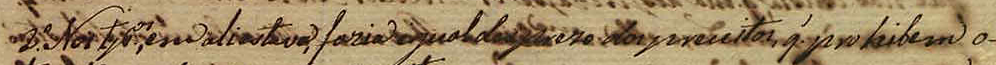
2.o Nos tp.os, em ali estava, fazia igual desprezo dos preceitos, q̄ prohibem o
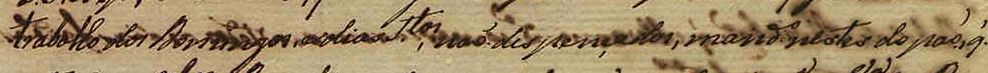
trabalho dos Domingos, e dias S.tos, naõ dispençados, mand.o nestes do paõ, q̄
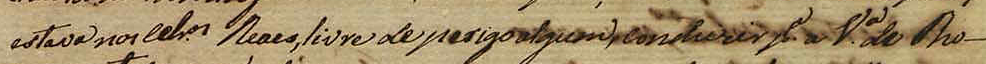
estava nos Celr.os Reaes, livre de perigo algum, conduzir pa. a V.a de Tho
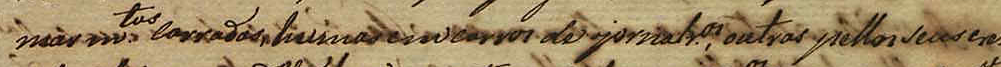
mar m.tas carradas, humas em carros de jornalr.o, outras pellos seus cre
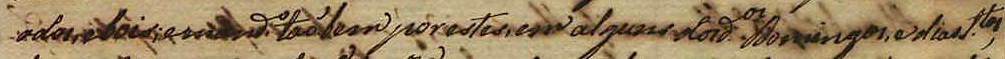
ados e bois; e mand.o taõbem por estes, em alguns dos d.os Domingos, e dias s.tos,
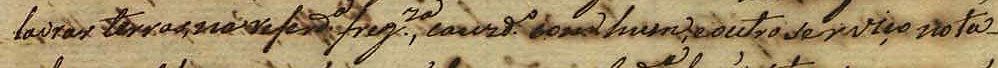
lavrar terras na referd.a freg.za, cauzd.o com hum, e outro serviço nota
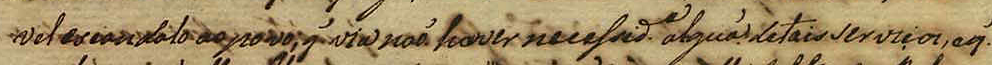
vel escandalo ao povo, q̄ via naõ haver necessid.a alguā de tais serviços, e q̄
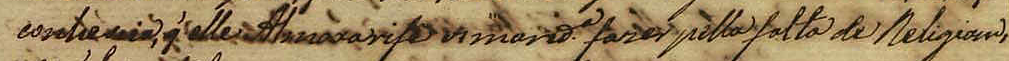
conhescia, q̄ elle Almoxarife os mand.a fazer pella falta de Religiam,
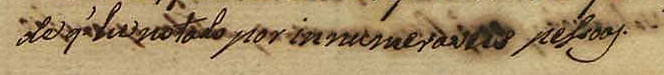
de q̄ he notado por innumeraveis pessoas.
